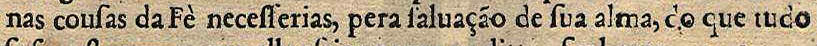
nas cousas da Fè necesserias, pera saluação de sua alma, do que tudo
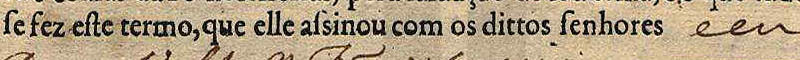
se fez este termo, que elle assinou com os dittos senhores e eu
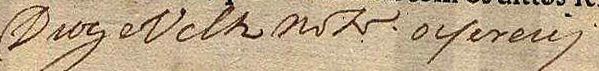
Diogo Velho notr.o o escreuj.
